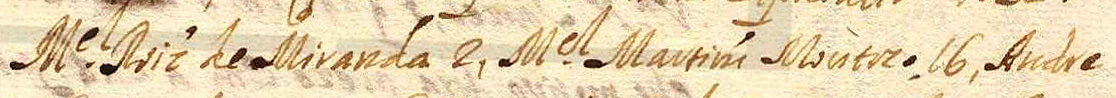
M.el Roiz̄ de Miranda 2, M.el Martins̄ Moutozo 16, Andre
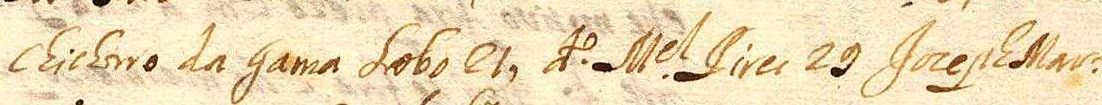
chichorro da Gama Lobo 21, d̄.o M.el Pires 29 Jozeph Mar
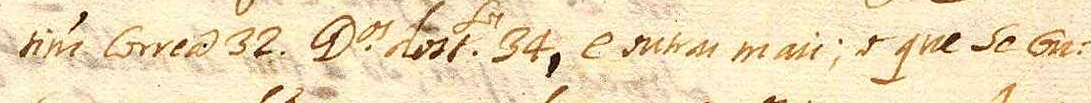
tins̄ Correa 32. D.os dos s.tos 34, e outras mais; o que se con
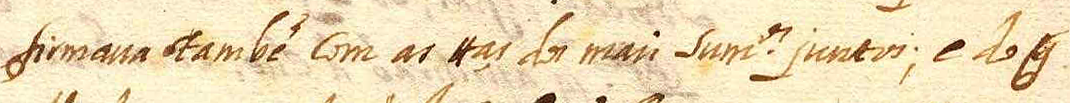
firmaua tambē com as tt,as dos mais sum.os juntos; e do q̄
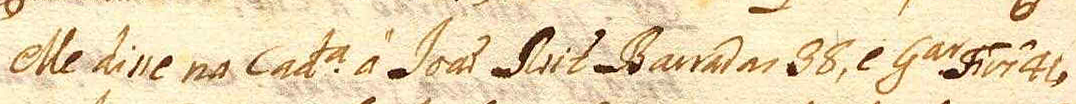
elle disse na cad̄.a à Ioaõ Roiz̄ Barradas 38, e Gar. Frs̄ 41,
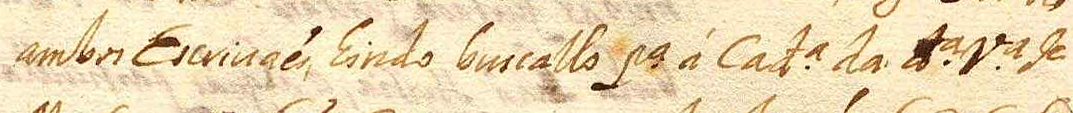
ambos Escriuaẽs hindo buscallo p.a á Cad̄.a da d̄.a V.a de
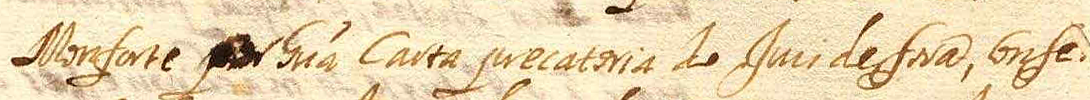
Monforte por huā Carta precatoria do Juis de fora, confe
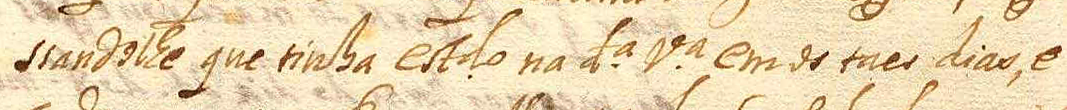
ssandolhe que tinha estd.o na d̄.a V.a em os taes dias, e
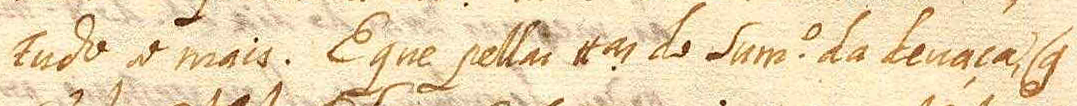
tudo o mais. E que pellas tt.as do Sum.o da deuaça, q̄
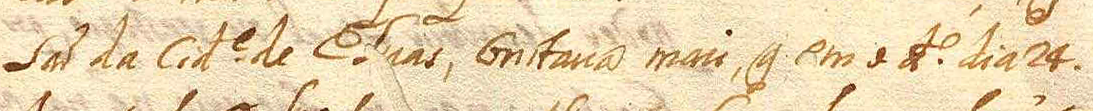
saõ da Cid̄.e de Eluas, constaua mais, q̄ em o d̄.o dia 24.
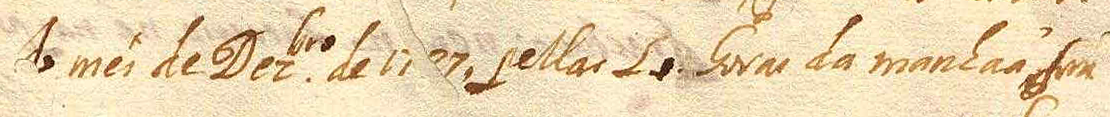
do mês de Dez.bro de 1727. pellas 10. horas da manhaã fora
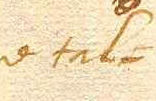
o tal
